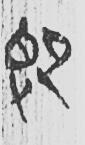即
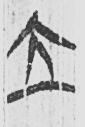立
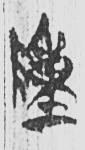陳
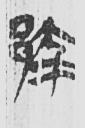○（蔡）
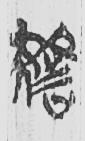{害夫}
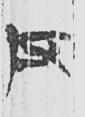反
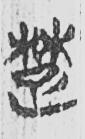楚
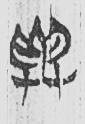與
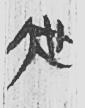吳
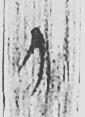人
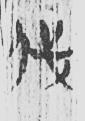伐
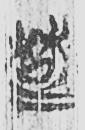楚
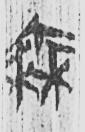秦
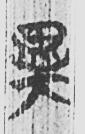異
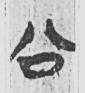公
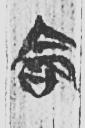命
